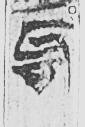{㠯ㅋ}
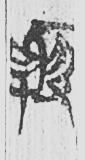與
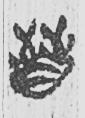晉
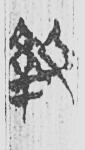{幸攴}
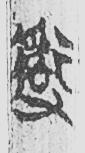{行亂}
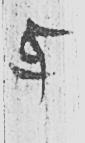与
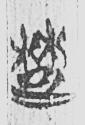楚
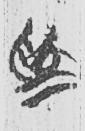爲
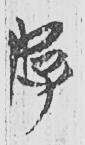好
